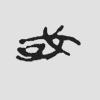或
